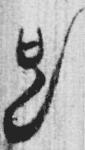也
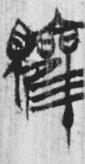觀
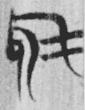於
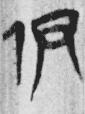伊
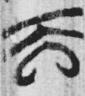而
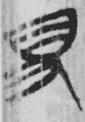○（得）
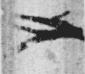之
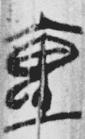○（娠）
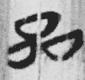厽（三）
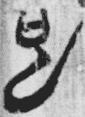也
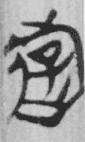遊
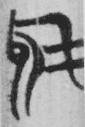於
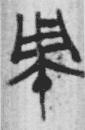央
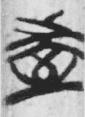臺
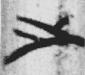之
